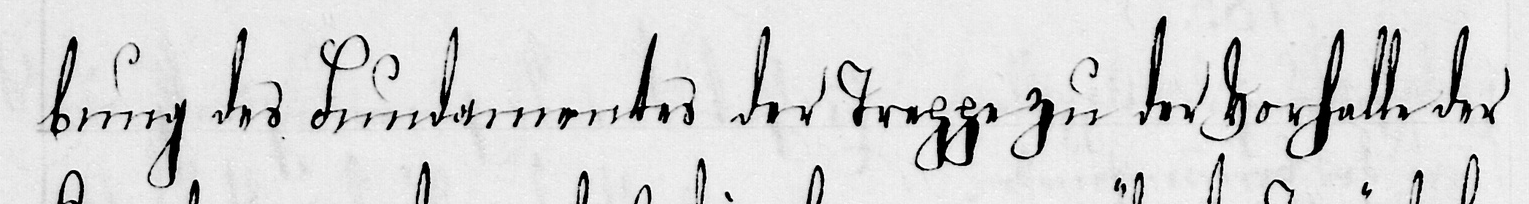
bung des Fundamentes der Treppe zu der Vorhalle
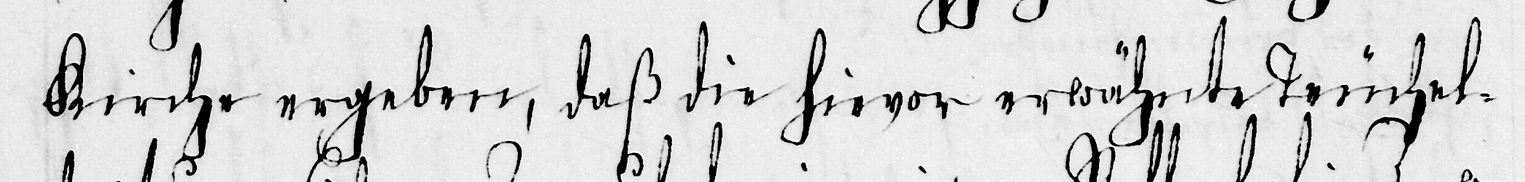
Kirche ergeben, daß die hievor erwähnte Teuchel¬
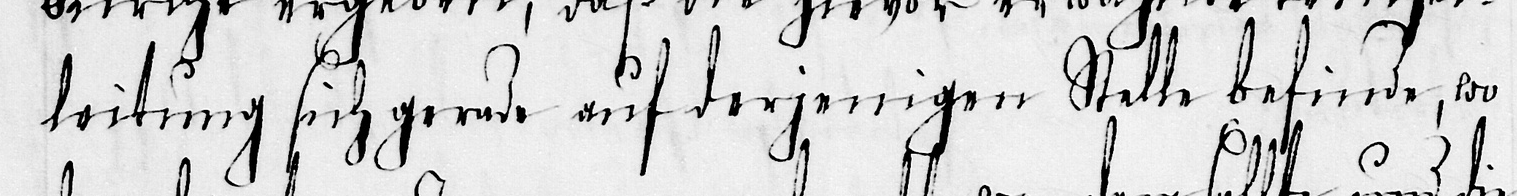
leitung sich gerade auf derjenigen Stelle befinde, wo
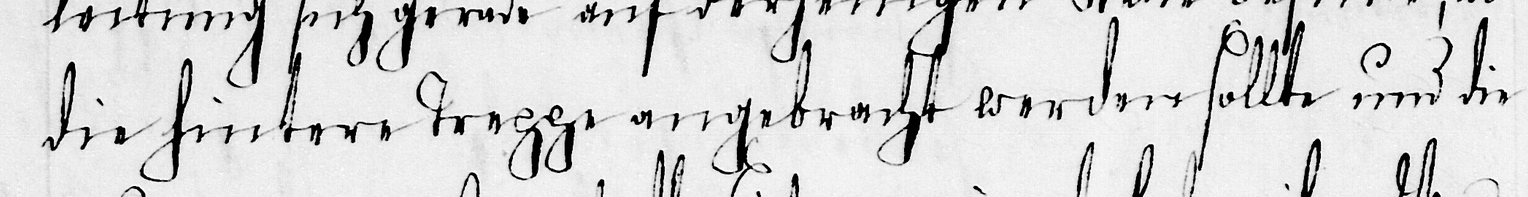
die hintere Treppe angebracht werden sollte und die
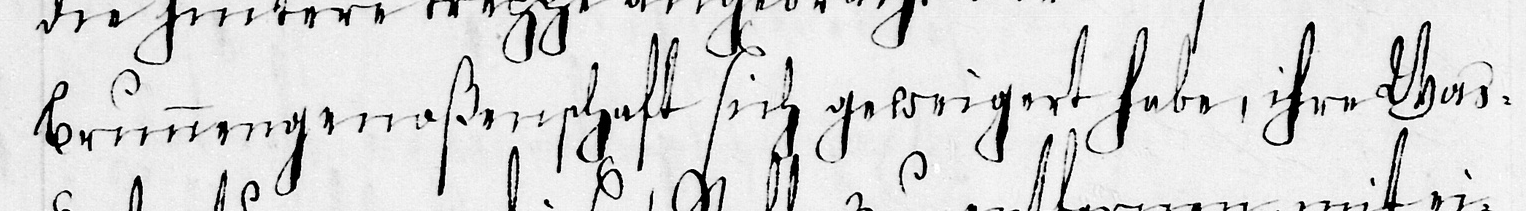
Brunnengenoßenschaft sich geweigert habe, ihre Wa¬
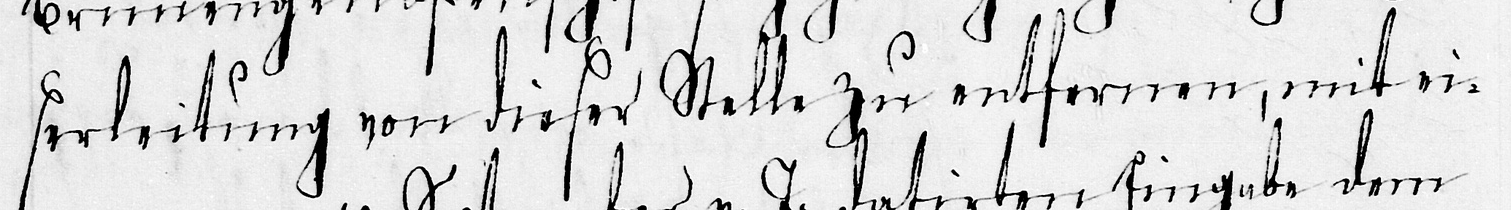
ßerleitung von dieser Stelle zu entfernen, mit ei¬
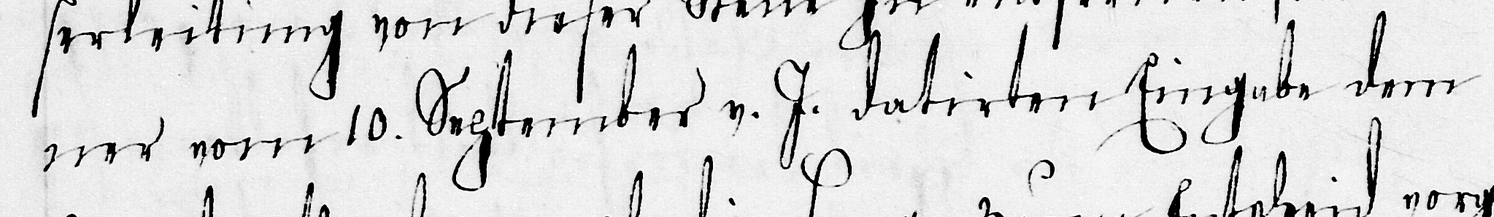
ner vom 10. September v. J. datirten Eingabe dem
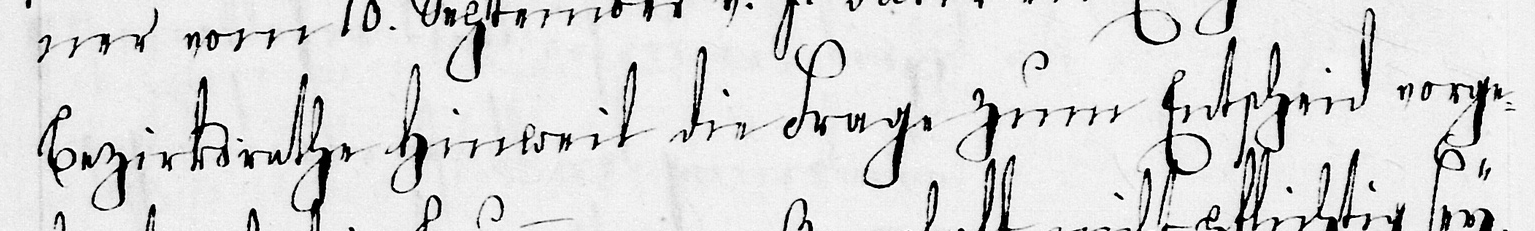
Bezirksrathe Hinweil die Frage zum Entscheid vorge¬
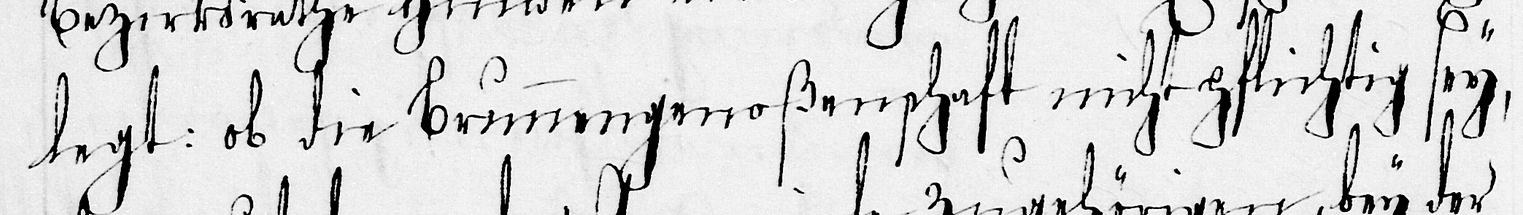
legt: ob die Brunnengenoßenschaft nicht pflichtig se¬
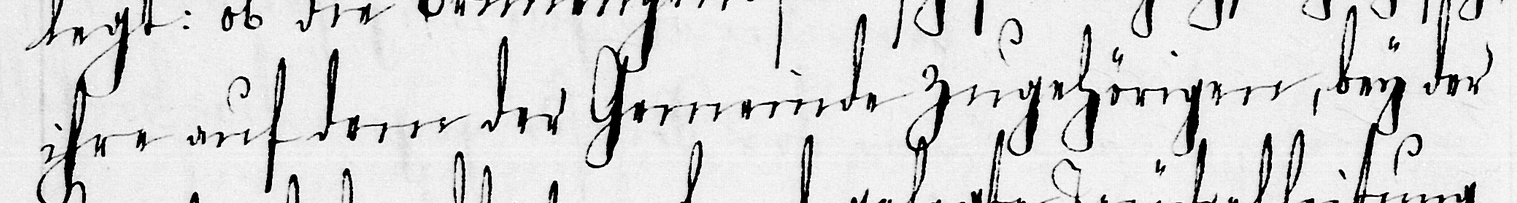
ihre auf dem der Gemeinde zugehörigen, bey der
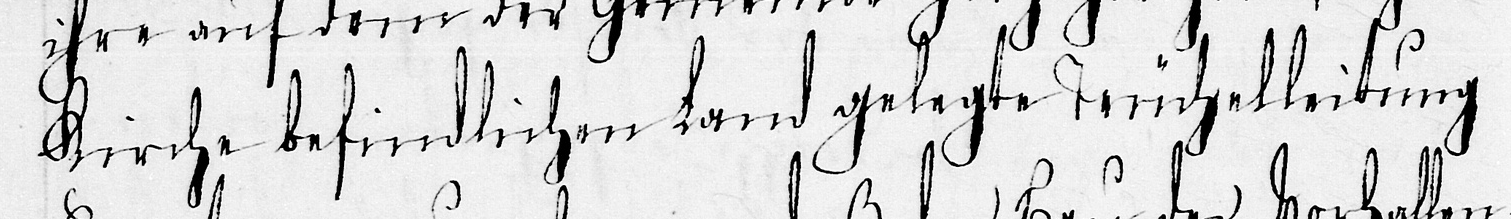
Kirche befindlichen Land gelegte Teuchelleitung
